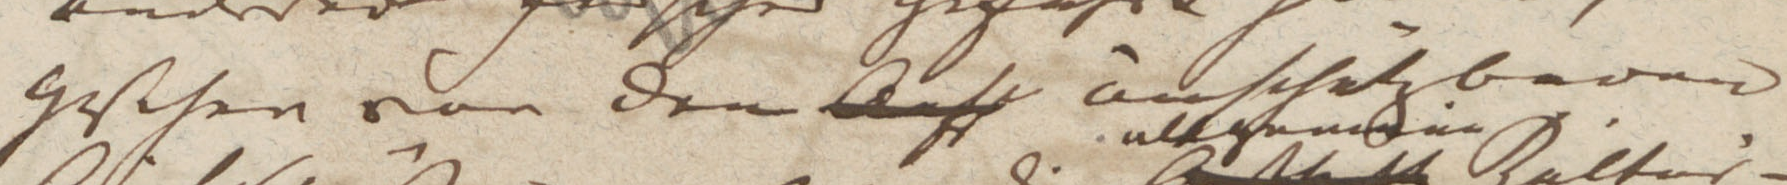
gesehen von den Aufs unschätzbaren
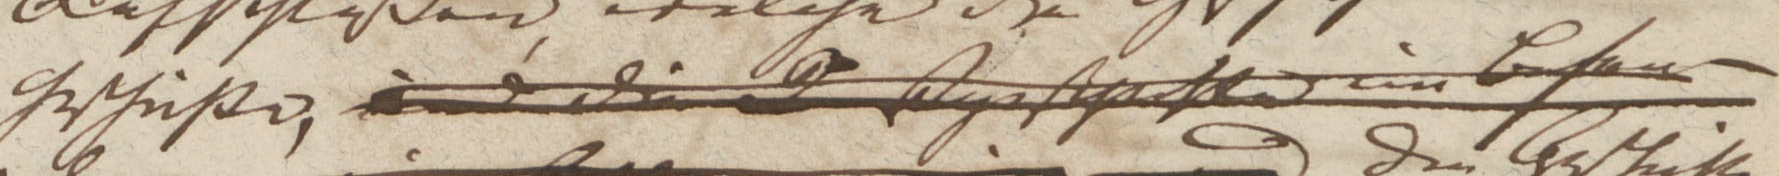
geschichte, und die Kunstgeschichte im Beson-
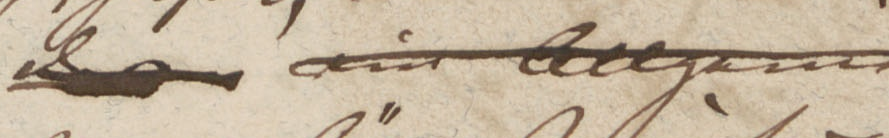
aber deren im Allgemeinen und
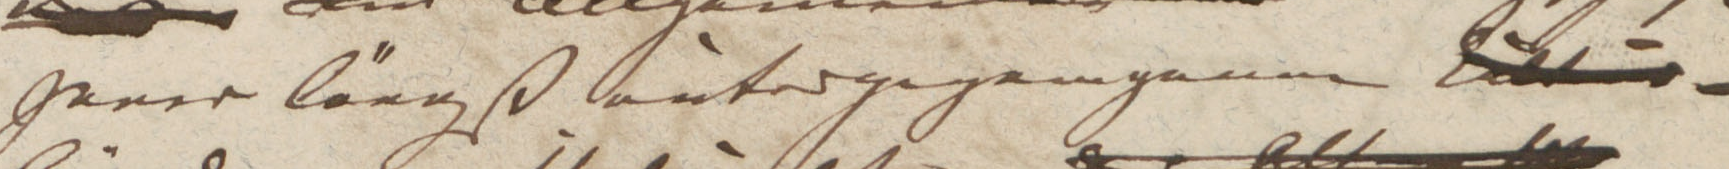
jener längst untergegamgenen Cultur-
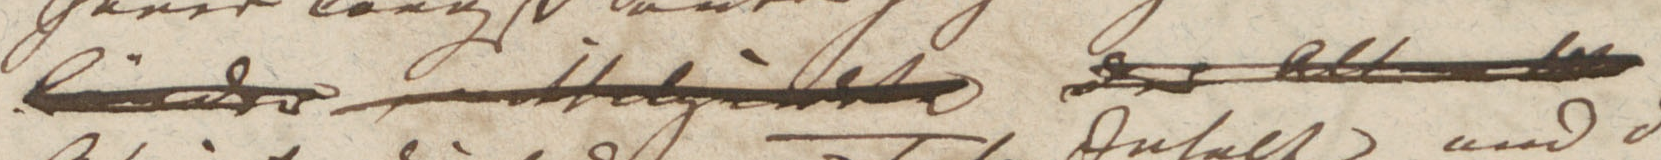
länder mittelpunkte der Alten W
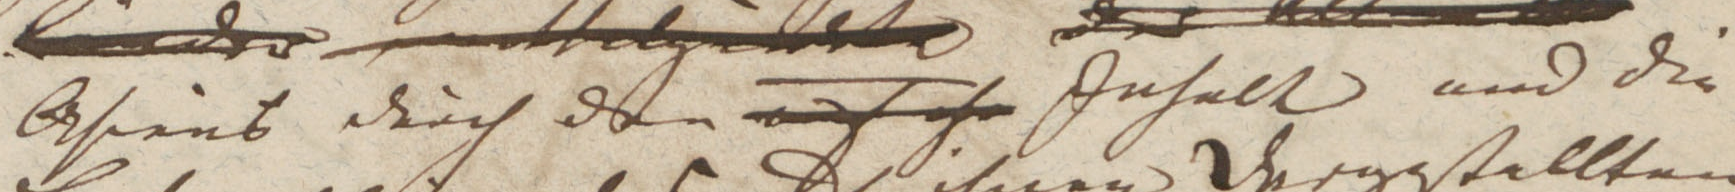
Asiens durch den auf ihr Inhalt und die
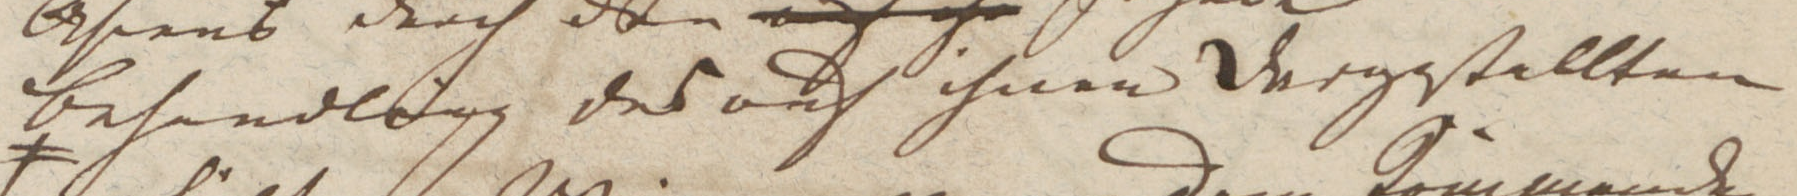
Behandlung des auf ihnen Dargestellten
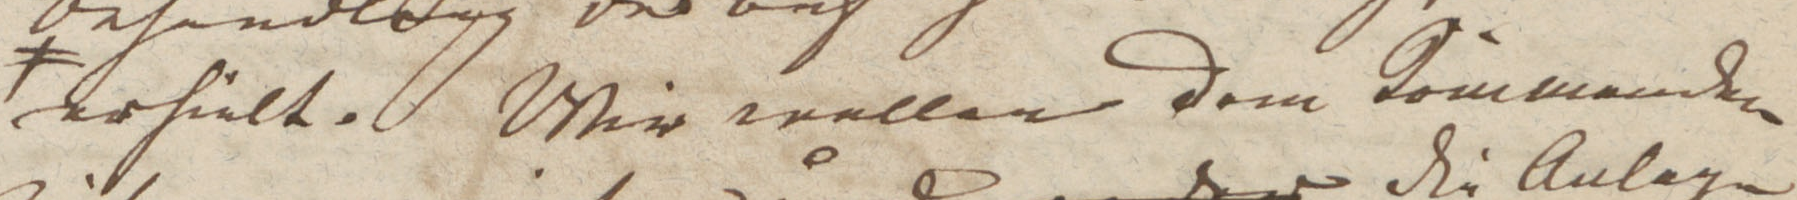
erhielt. Wir wollen dem Kommenden
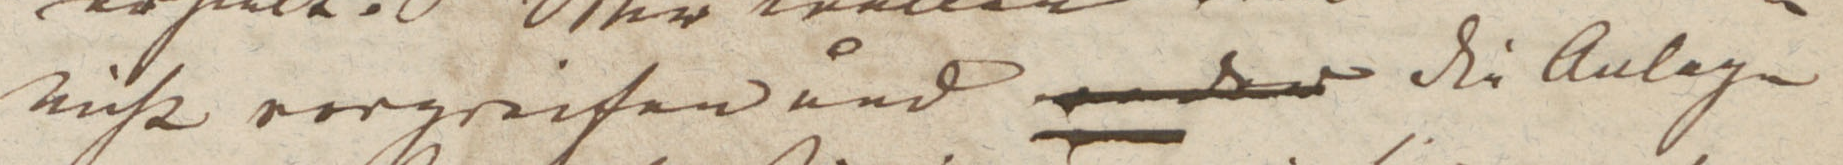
nicht vorgreifen und der die Anlage
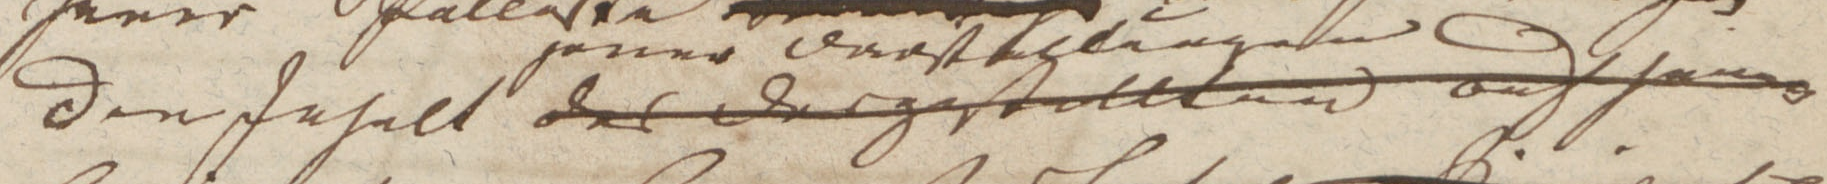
wie den Inhalt des Dargestellten auf jenen jener
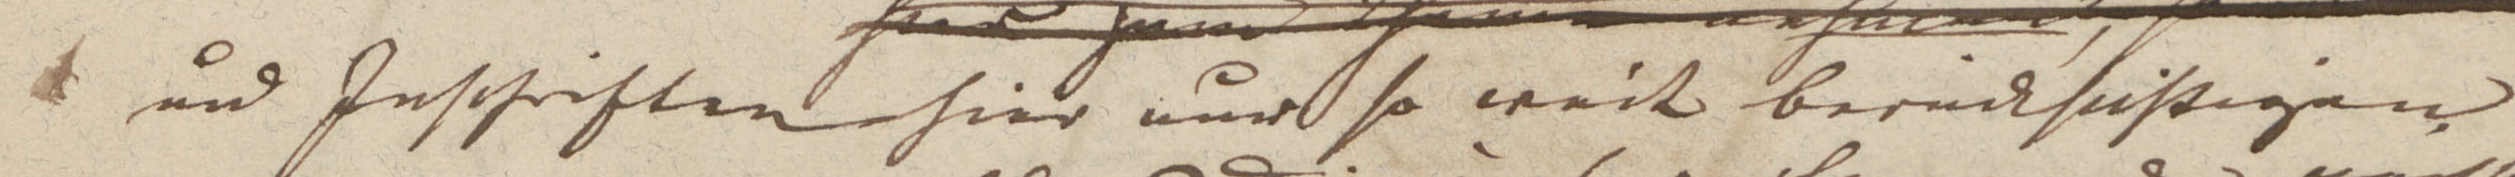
und Inschriften hier nur so weit berücksichtigen,
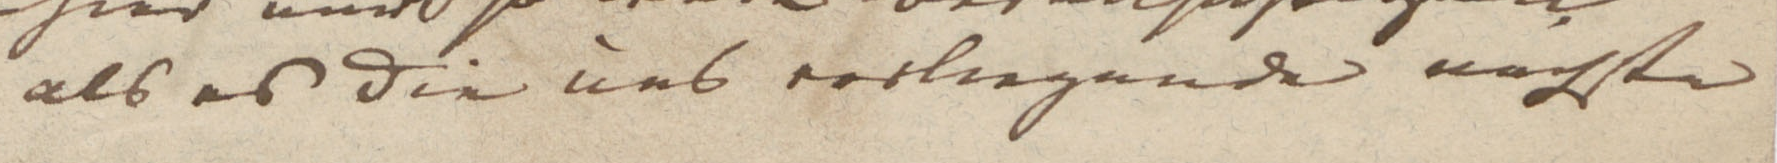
als es die uns vorliegende nächste
